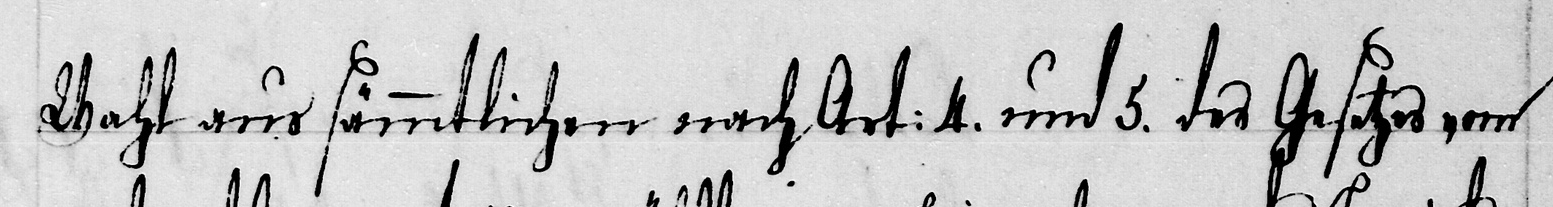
Wahl aus sämmtlichen nach Art: 4. und 5. des Gesetzes vom
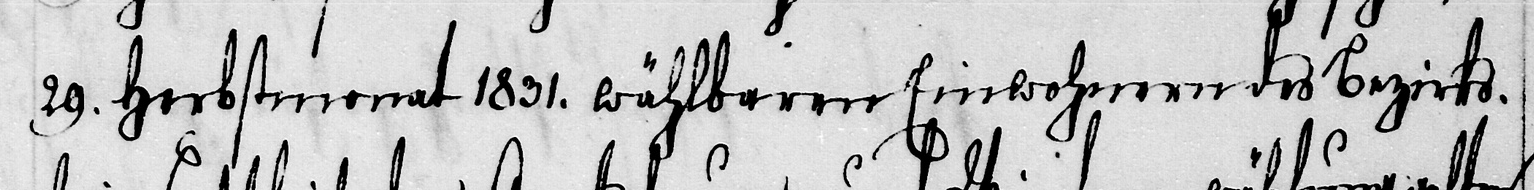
29. Herbstmonat 1831. wählbaren Einwohnern des Bezirks.
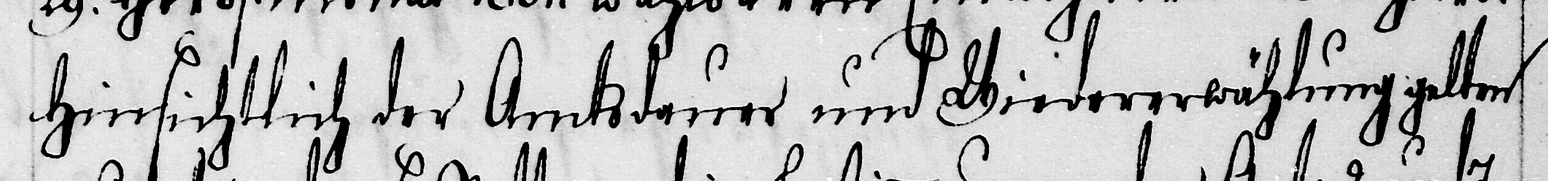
Hinsichtlich der Amtsdauer und Wiedererwählung gelten
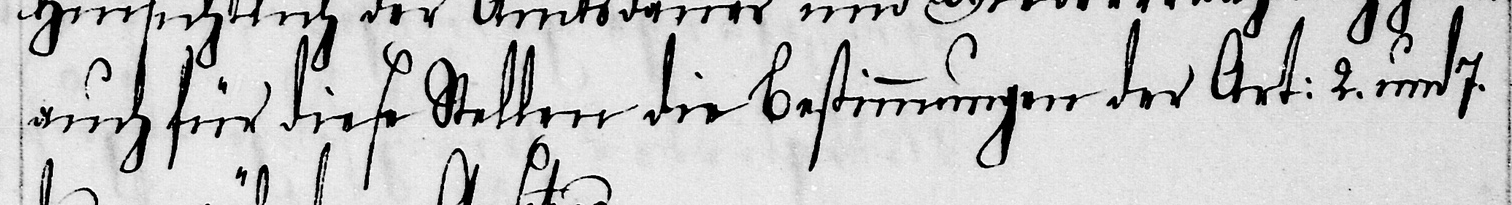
auch für diese Stellen die Bestimmungen der Art: 2. und 7.
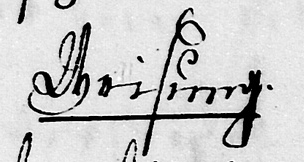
Weisung.
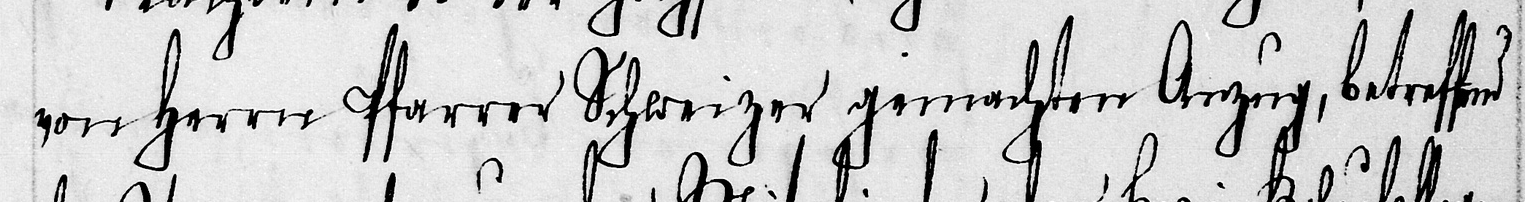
von Herrn Pfarrer Schweizer gemachten Anzug, betreff¬
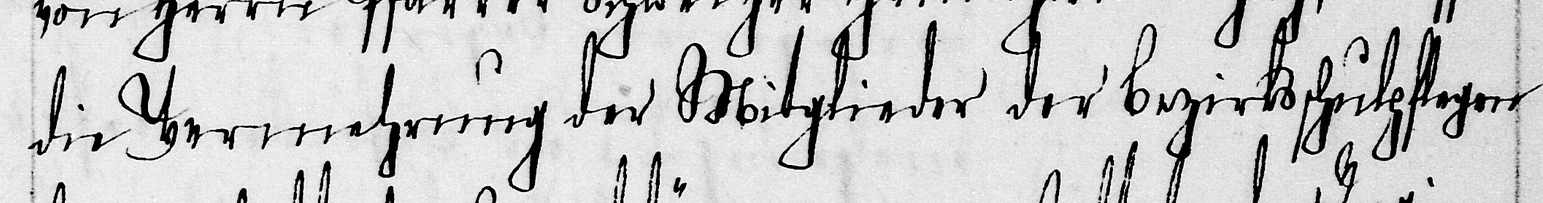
die Vermehrung der Mitglieder der Bezirksschulpflegen
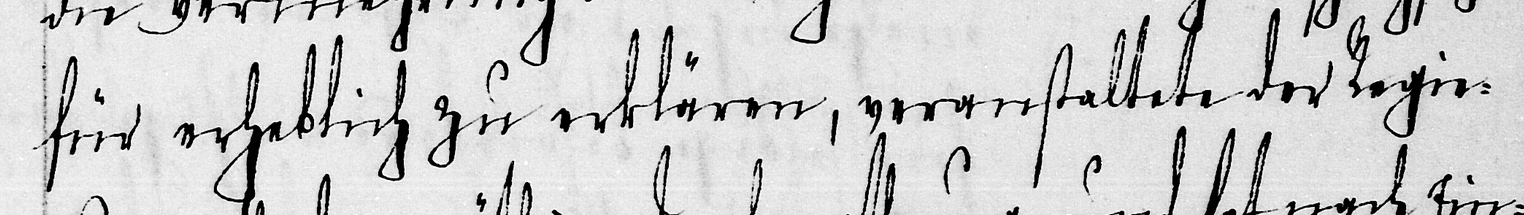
für erheblich zu erklären, veranstaltete der Regie¬
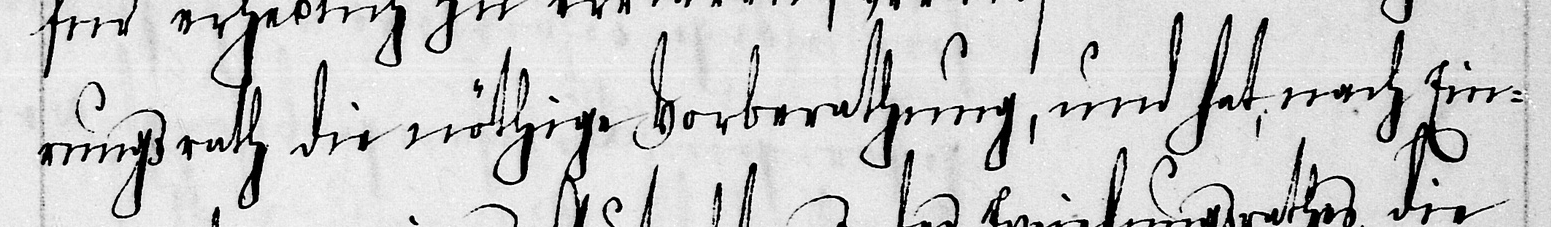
rungsrath die nöthige Vorberathung, und hat, nach Ein¬
